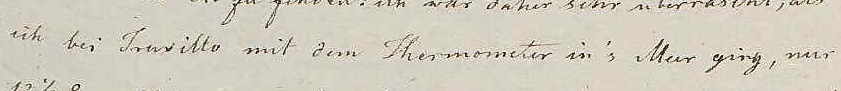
ich bei Truxillo mit dem Thermometer in's Meer ging, nur
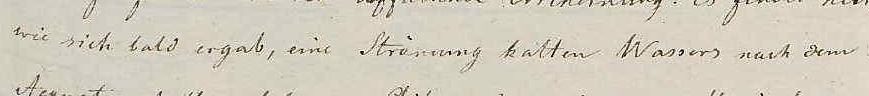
wie sich bald ergab, eine Strömung kalten Wassers nach dem
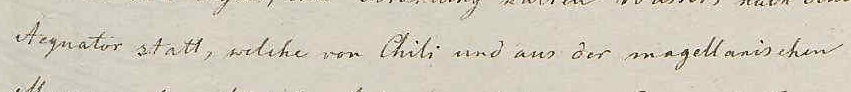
Aequator statt, welche von Chili und aus der magellanischen
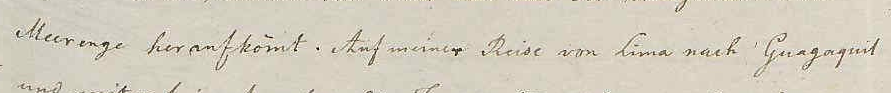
Meerenge heraufkömt. Auf meiner Reise von Lima nach Guagaquil
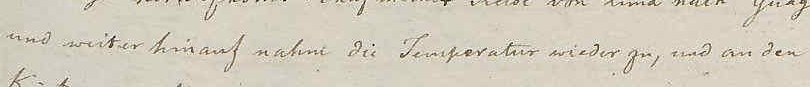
und weiter hinauf nahm die Temperatur wieder zu, und an den
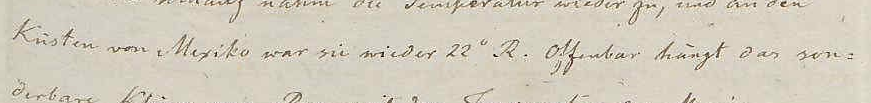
Küsten von Mexiko war sie wieder 22° R. Offenbar hängt das son-
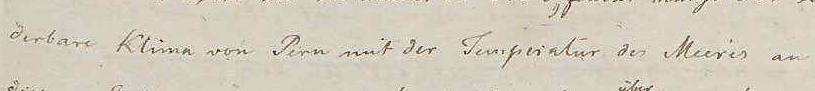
derbare Klima von Peru mit der Temperatur des Meeres an
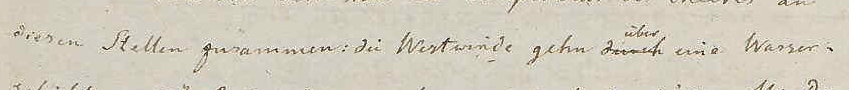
diesen Stellen zusammen: die Westwinde gehn durchüber eine Wasser-
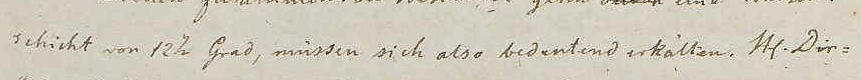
schicht von 12½ Grad, müssen sich also bedeutend erkälten. H￼. Dir-
